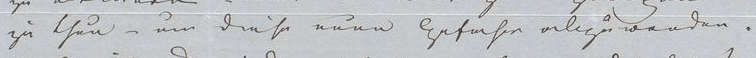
zu thun – um diese neue Gefahr abzuwenden.
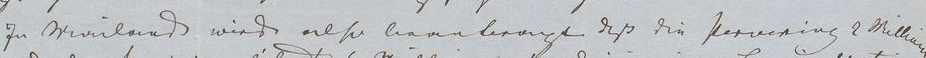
In Mailand wird also beantragt daß die Provinz 2 Millionen
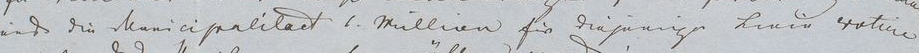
und die Municipalitaet 1. Million für diejenige Linie votire
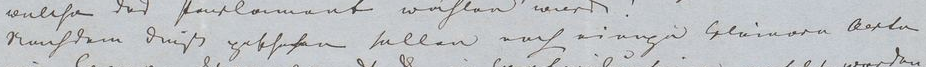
Nachdem dieß geschehen sollen noch einige kleinere Orte
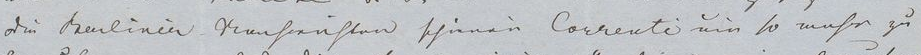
Die Berliner Nachrichten schienen Correnti um so mehr zu
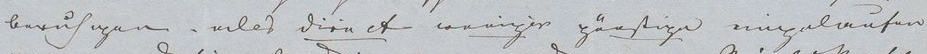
beruhigen – als directwenigergünstige eingelaufen
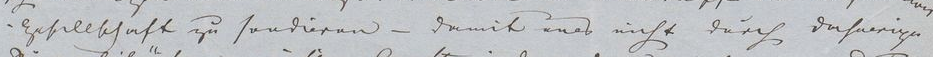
-Gesellschaft zu sondiren – damit uns nicht durch daherige
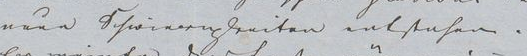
neue Schwierigkeiten entstehen. –
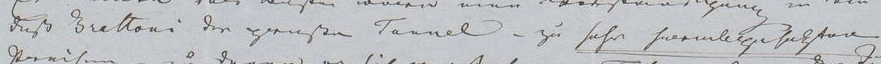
daß Grattoni der große Tunnel – zu sehr herabgesetzten
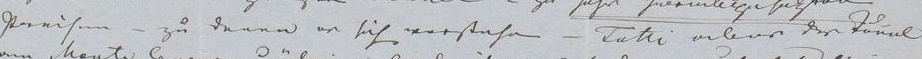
Preisen – zu denen er sich verstehe – Tatti aber der Tunnel
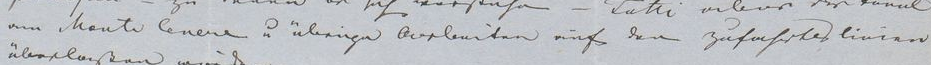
am Monte Cenere u übrige Arbeiten auf den Zufahrtslinien
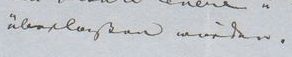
überlaßen würden.
